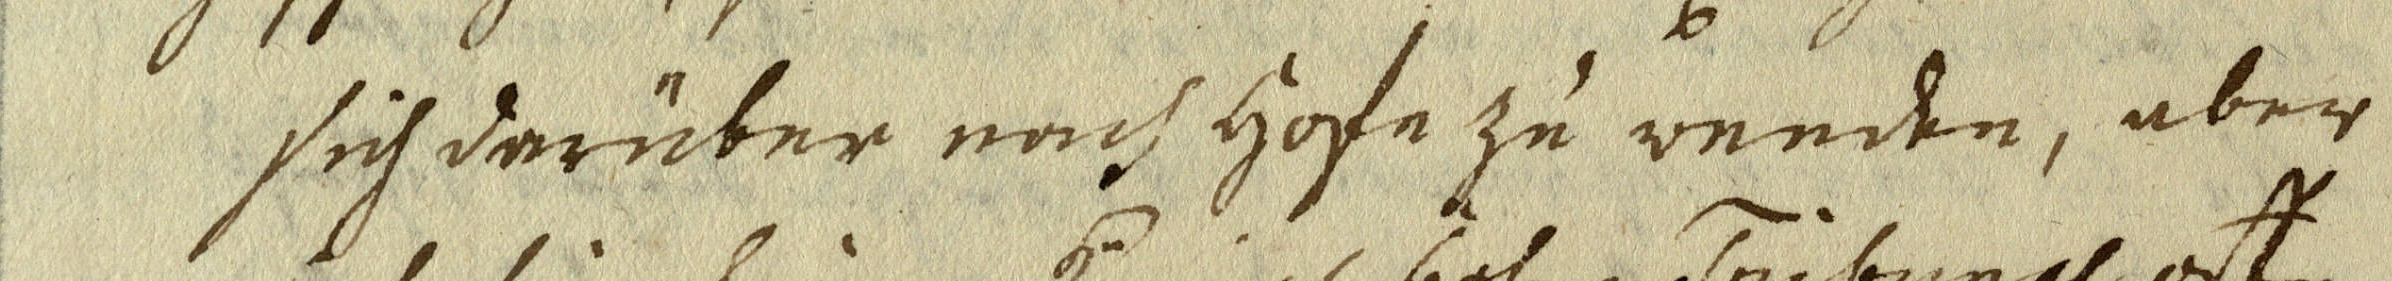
sich darüber nach Hofe zu wenden, aber
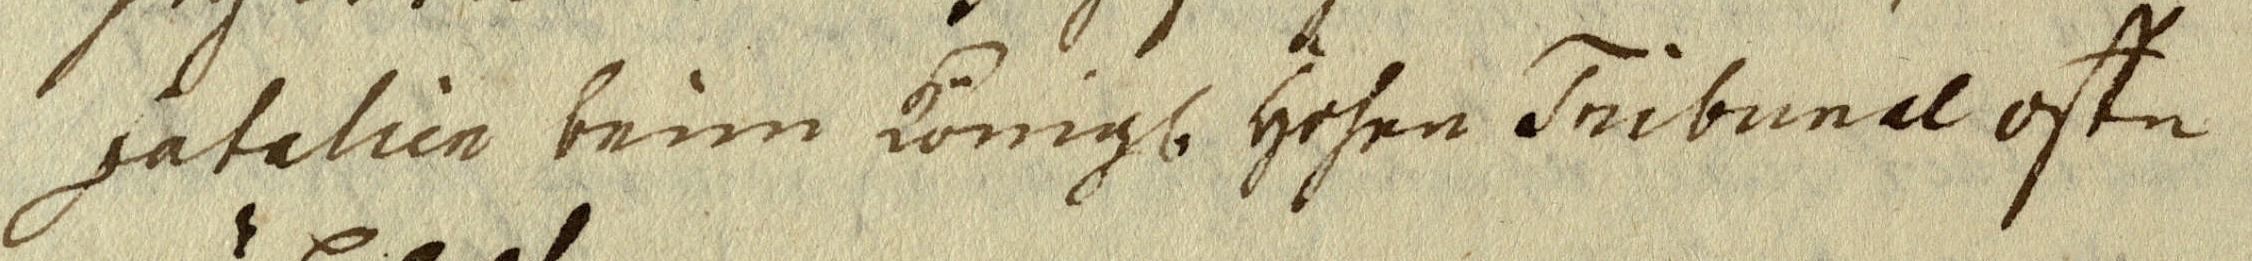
fatalien beim Königl. Hohen Tribunal offen
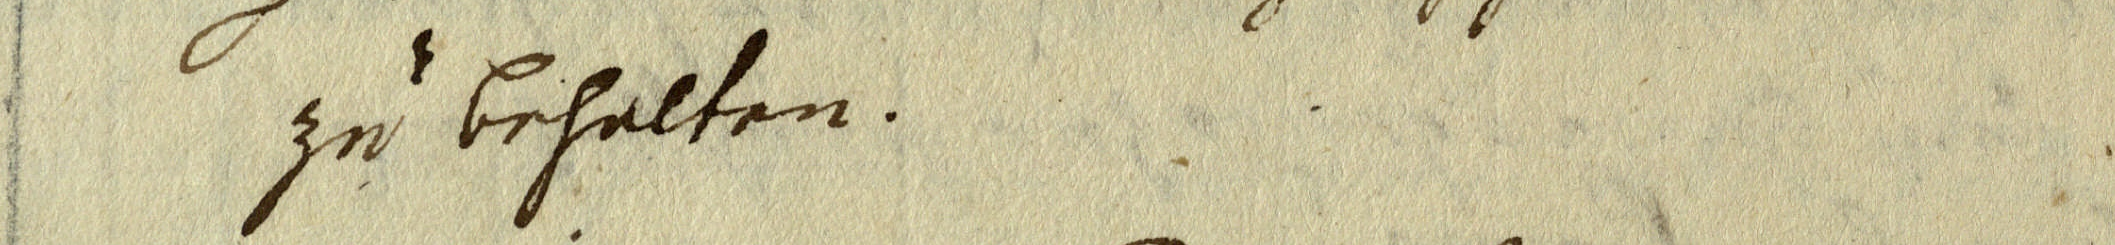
zu behalten.
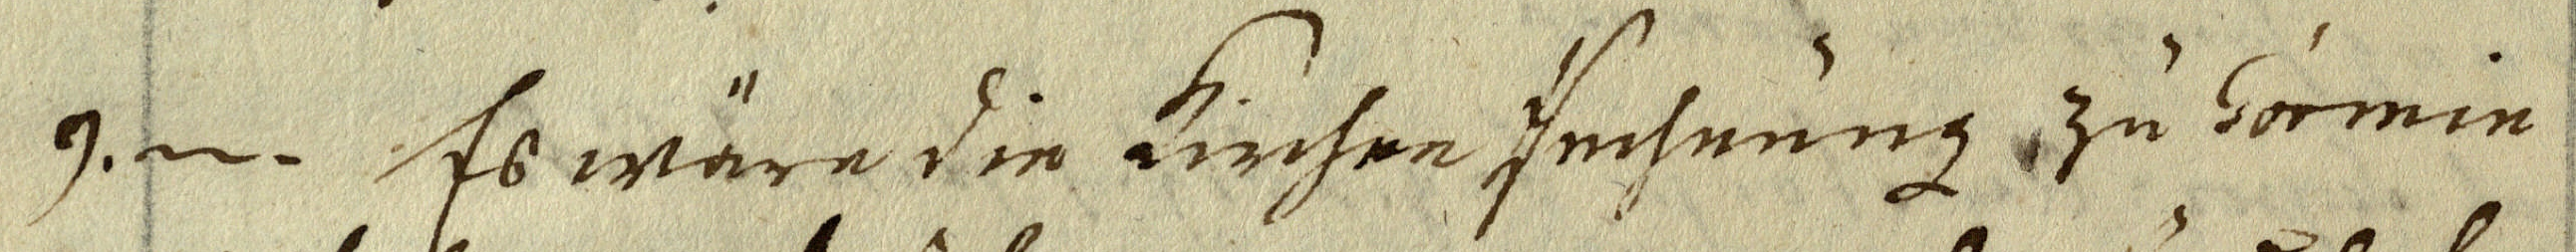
8. Es wäre die Kirchen Rechnung zu Görmin
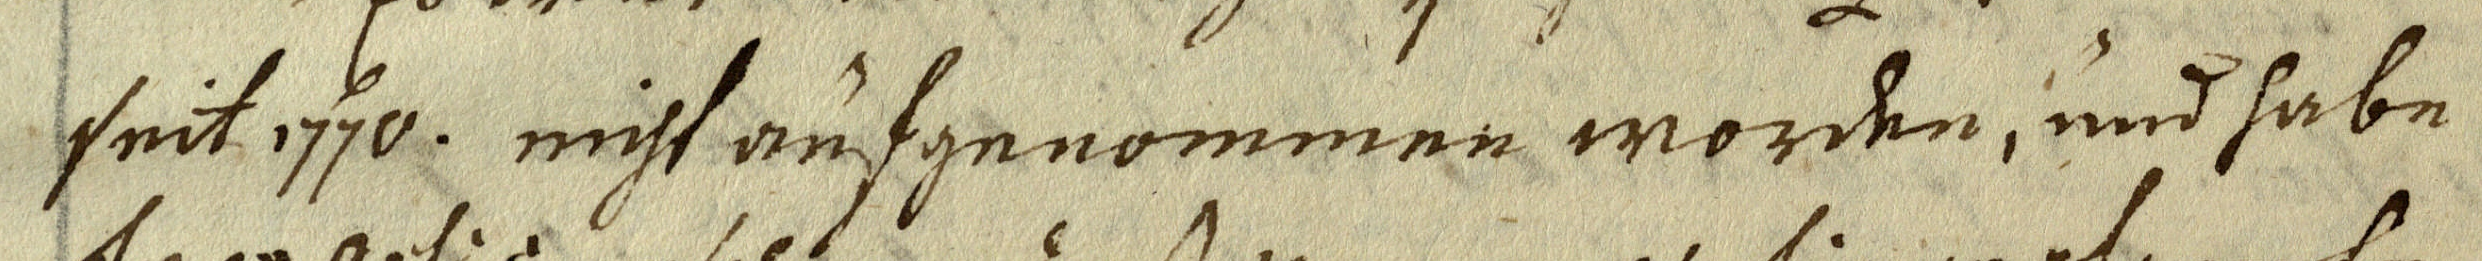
seit 1770 nicht aufgenommen worden, und habe
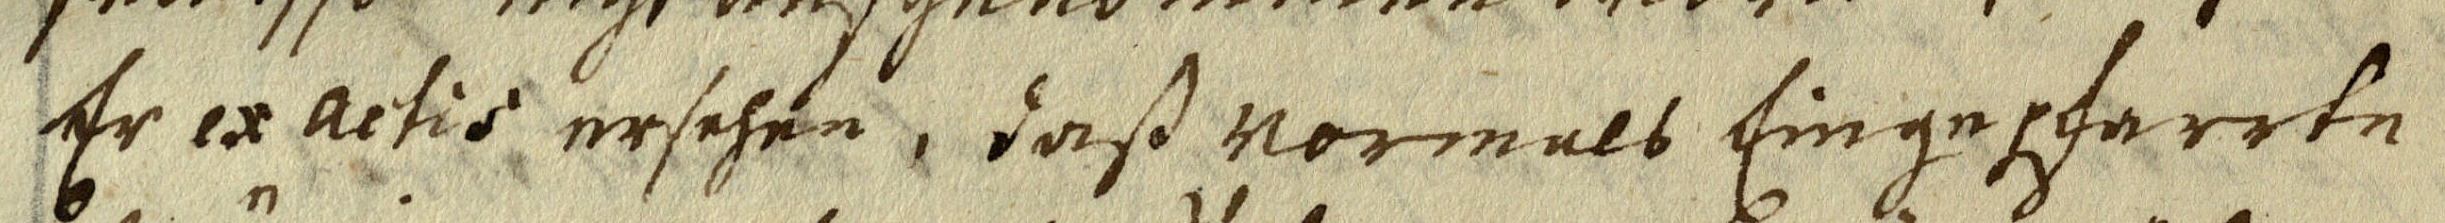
Er ex actis ersehen, daß vormals Eingepfarrte
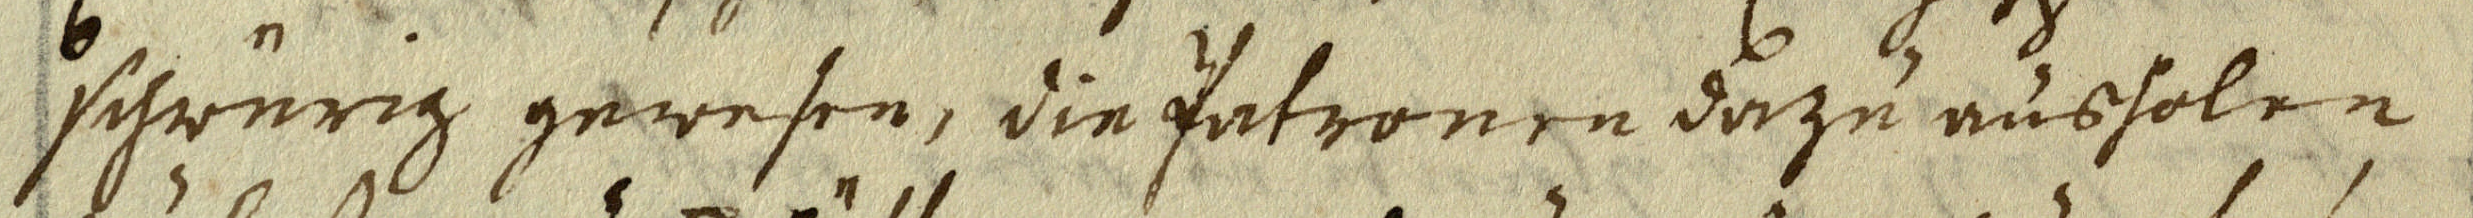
schwürig gewesen, die Patronen dazu ausholen
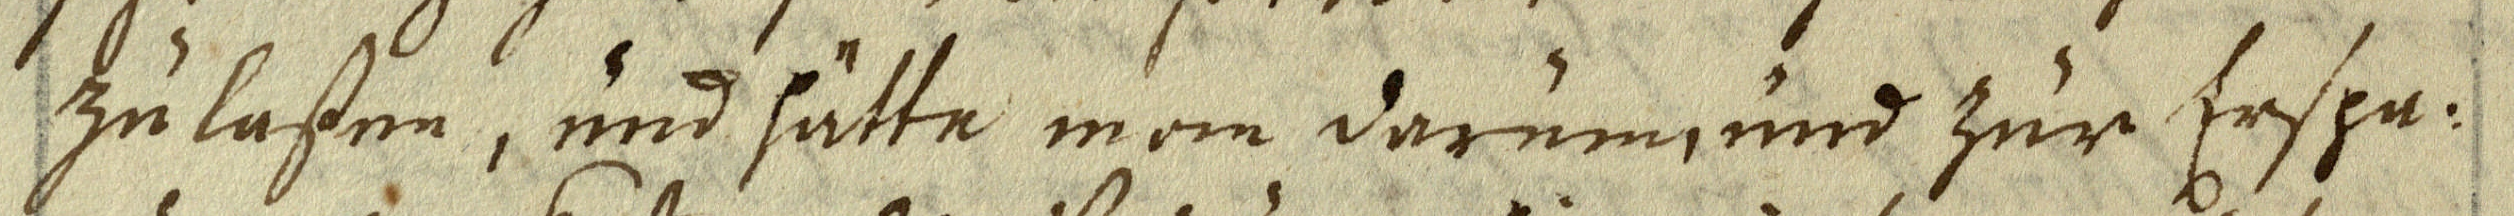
zu laßen, und hätte man darum und zur Erspa¬
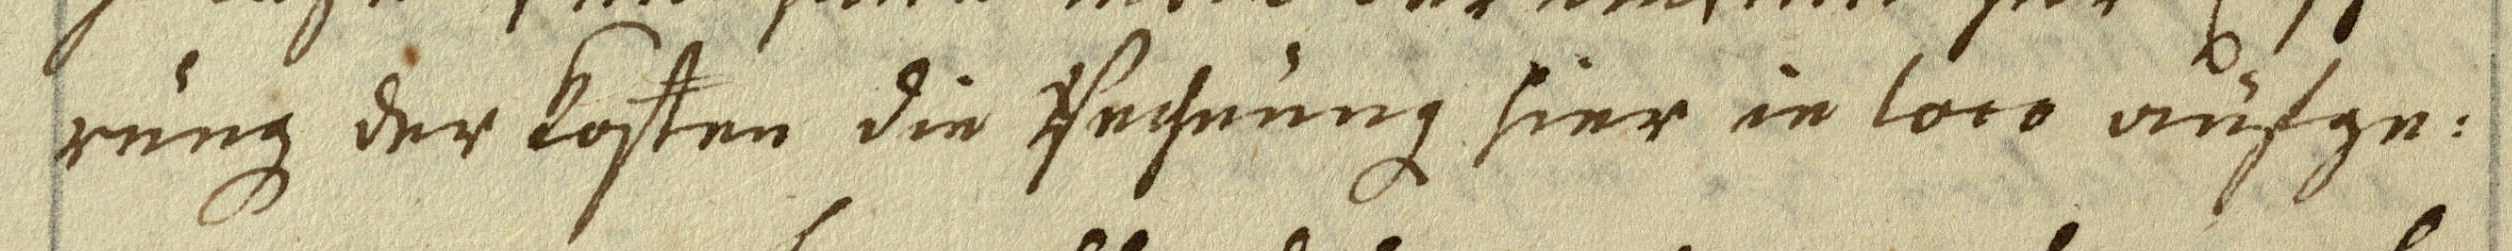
rung der Kosten die Rechnung hier in loco aufge¬
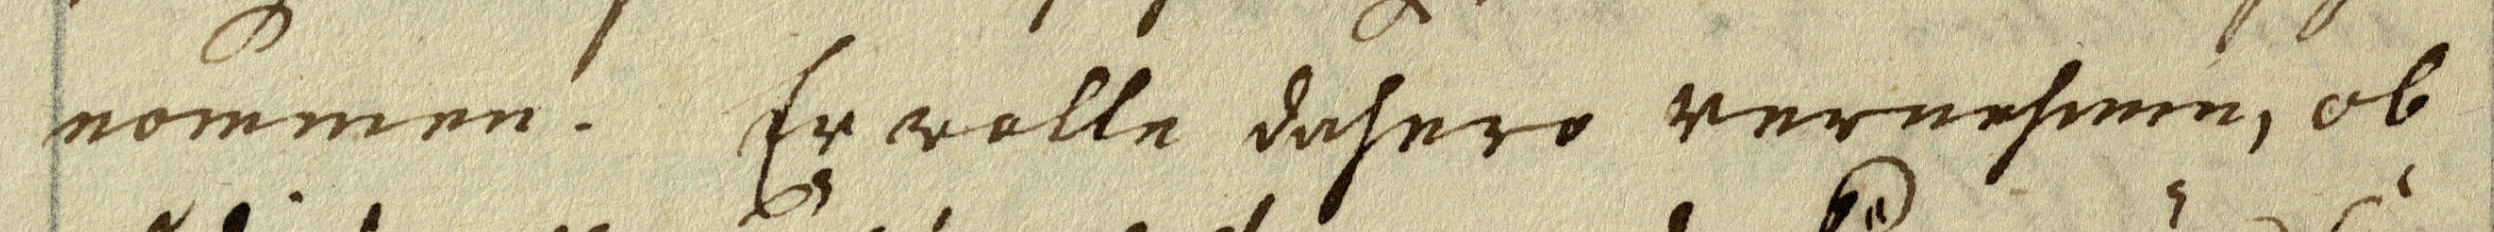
nommen. Er wolle dahero vernehmen, ob
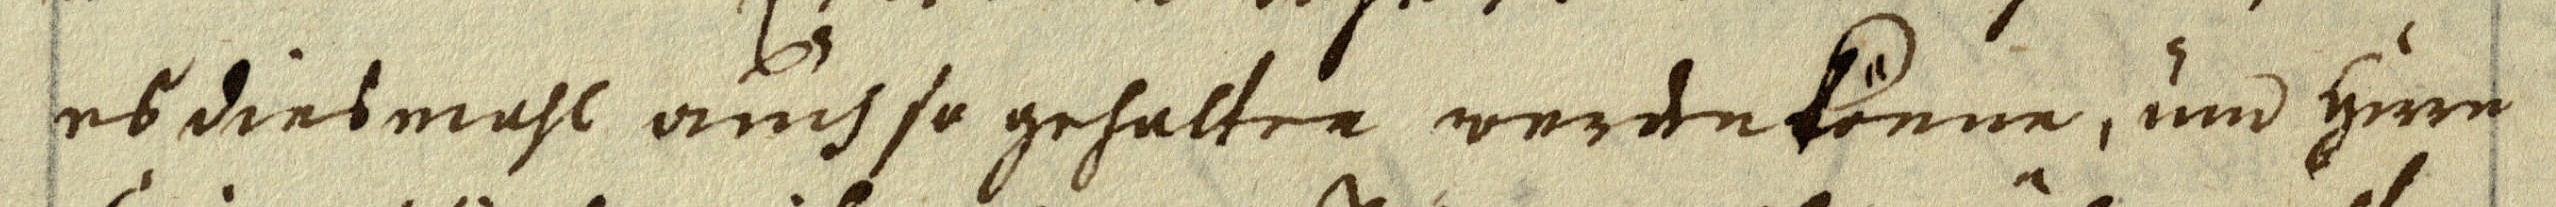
es diesmahl auch so gehalten werden könne, und Herrn
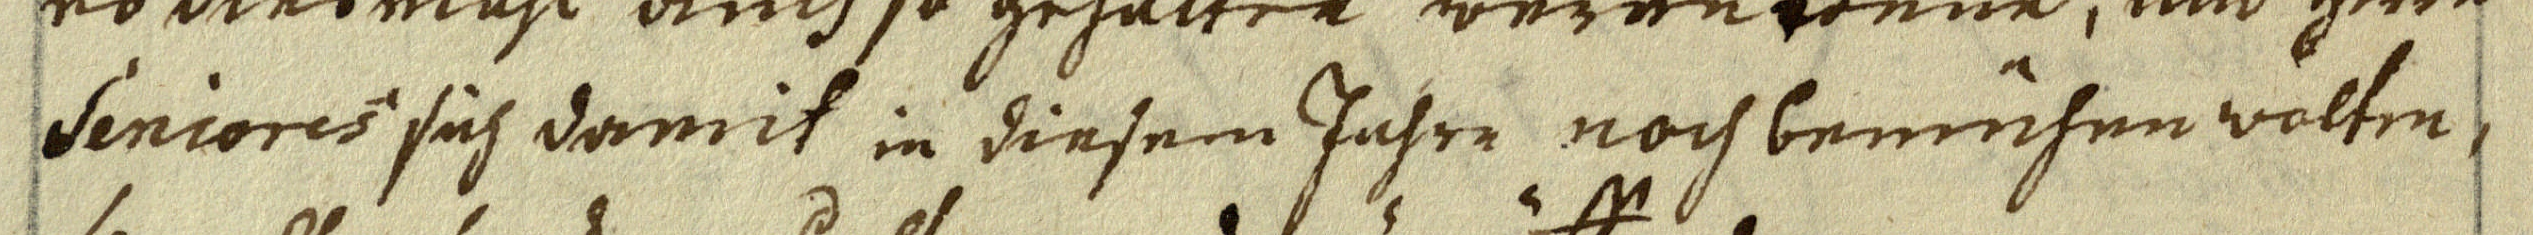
Seniores sich damit in diesem Jahre noch bemühen wolten,
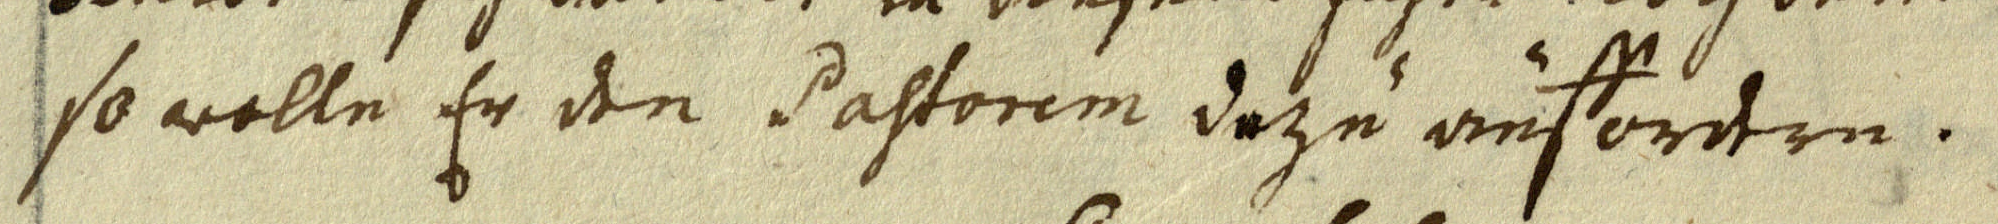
so wolle Er den Pastorem dazu auffordern.
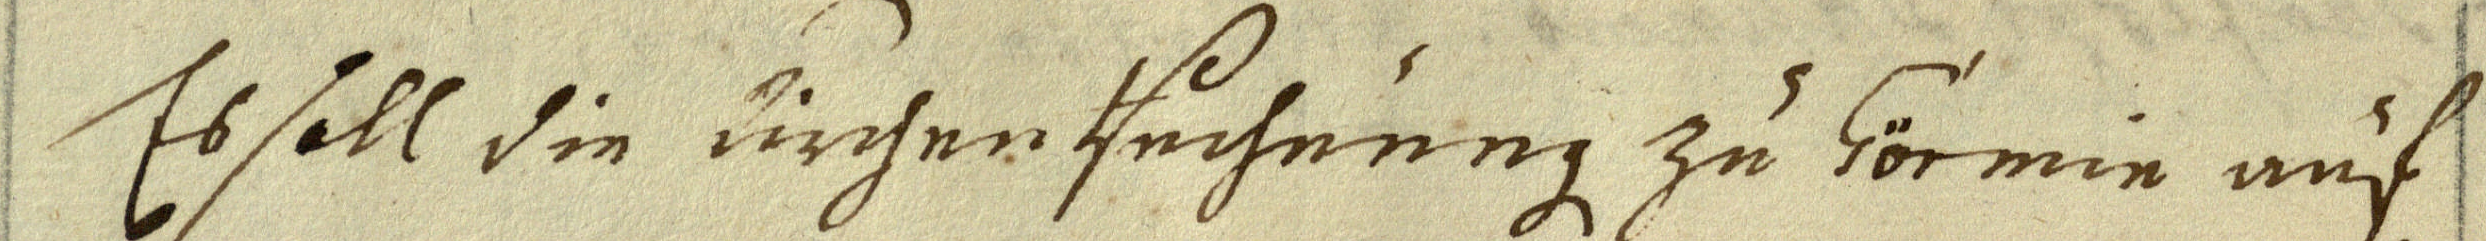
Es soll die Kirchen Rechnung zu Görmin auf
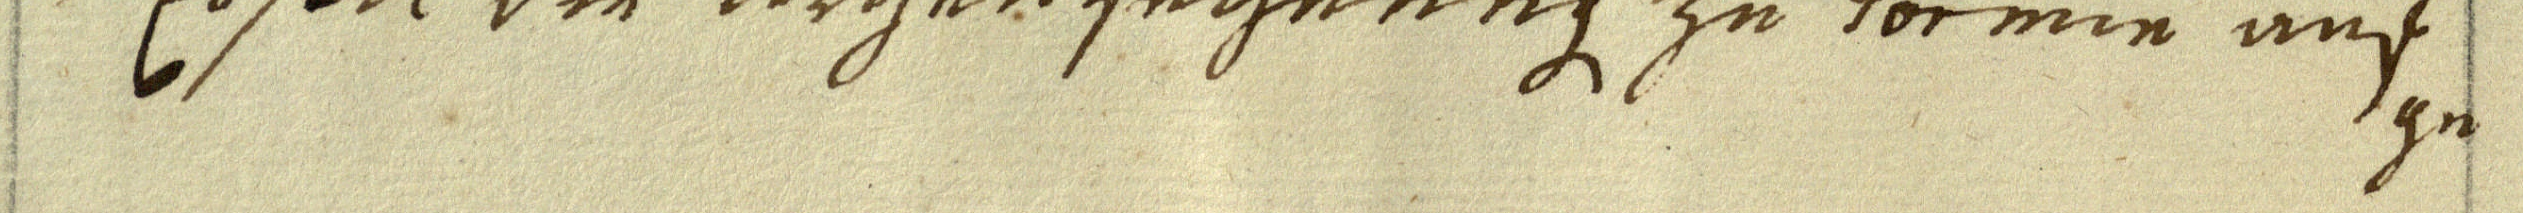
ge
